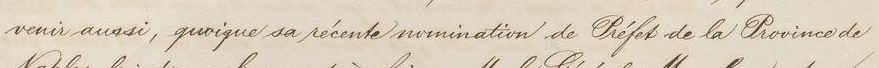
venir aussi, quoique sa récente nomination de Préfet de la Province de
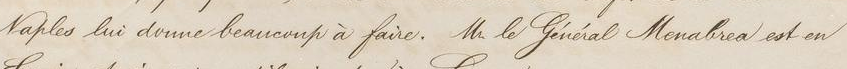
Naples lui donne beaucoup à faire. Mr le Général Menabrea est en
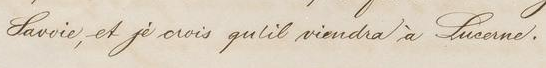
Savoie, et je crois qu'il viendra à Lucerne.
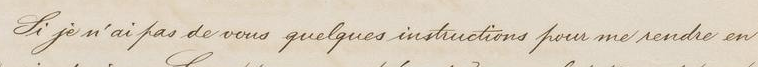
Si je n'ai pas de vous quelques instructions pour me rendre en
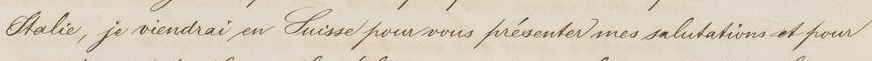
Italie, je viendrai en Suisse pour vous présenter mes salutations et pour
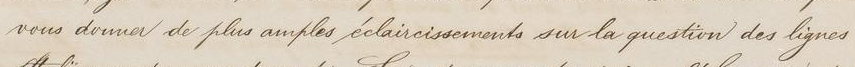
vous donner de plus amples éclaircissements sur la question des lignes
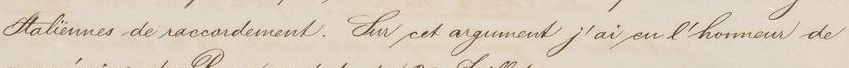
Italiennes de raccordement. Sur cet argument j'ai eu l'honneur de
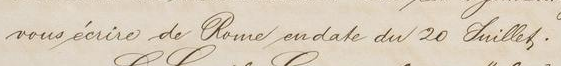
vous écrire de Rome en date du 20 Juillet.
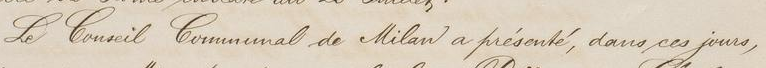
Le Conseil Communal de Milan a présenté, dans ces jours,
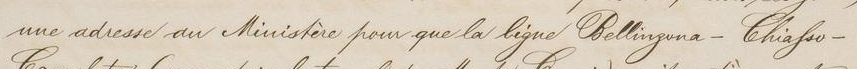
une adresse au Ministère pour que la ligne Bellinzone – Chiasso –
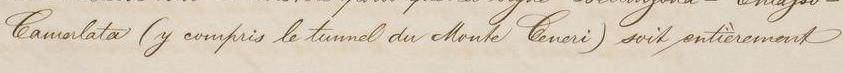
Camerlata (y compris le tunnel du Monte Ceneri) soit entièrement
